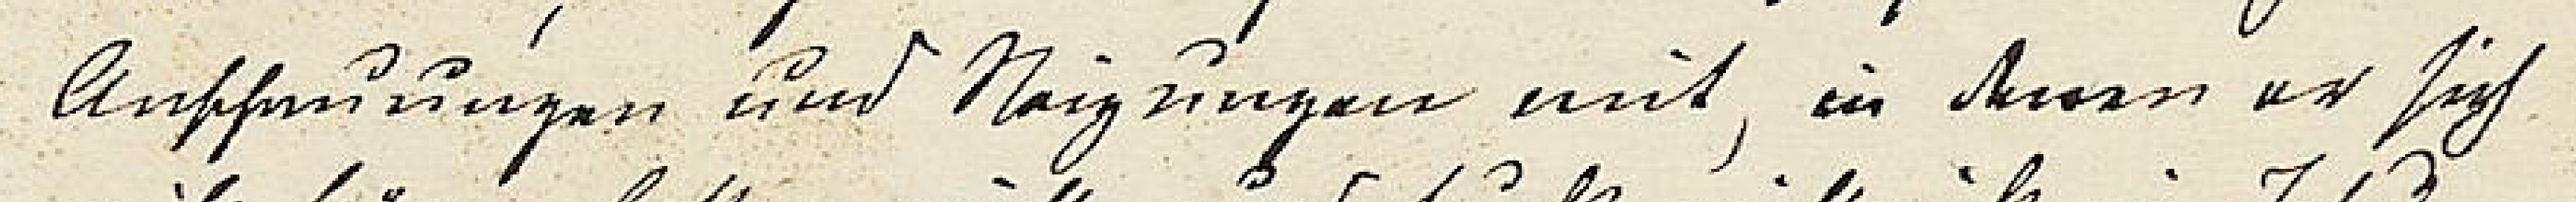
Anschauungen und Neigungen mit, in denen er sich
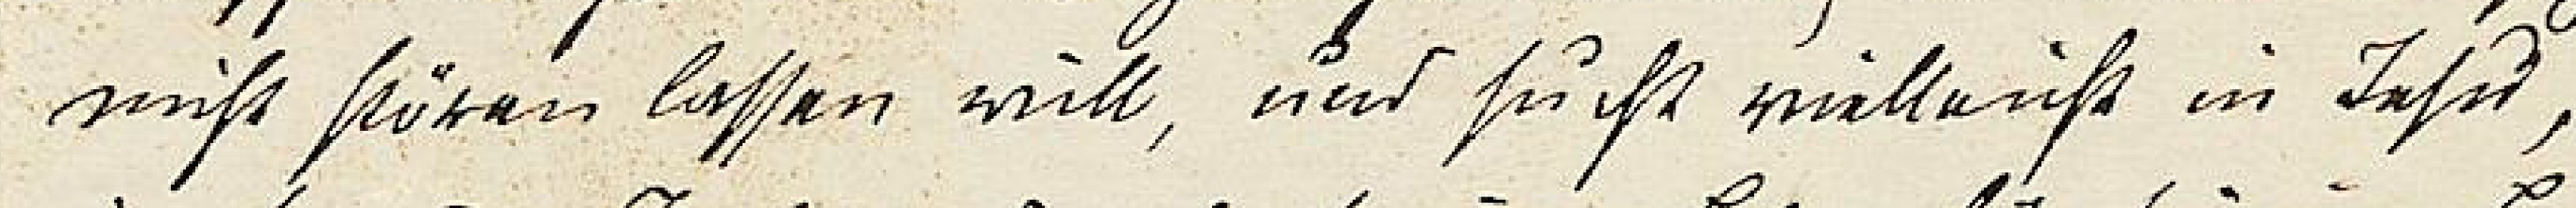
nicht stören lassen will und sucht viellenicht in Jesu,
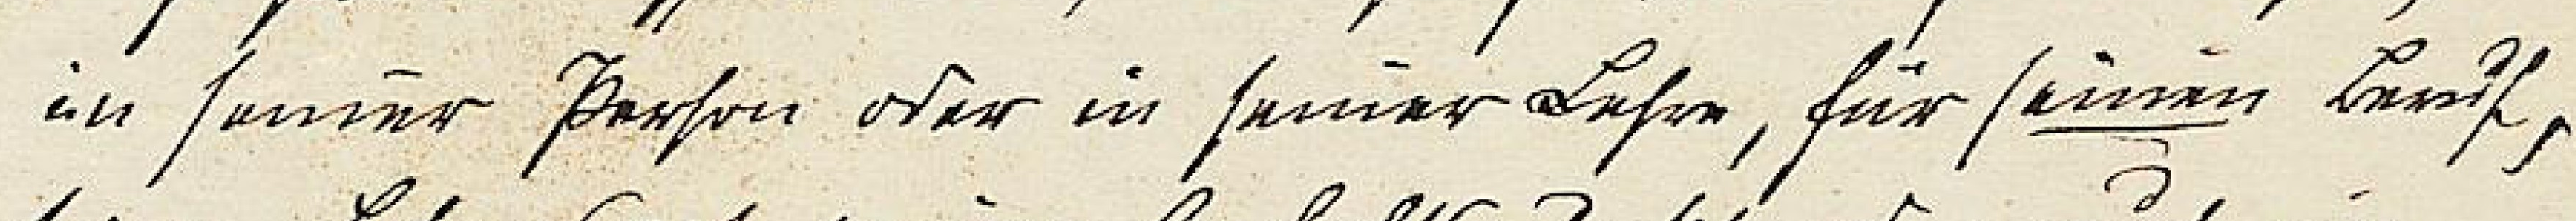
in seiner Person oder in seiner Lehre, für seinen Beruf,
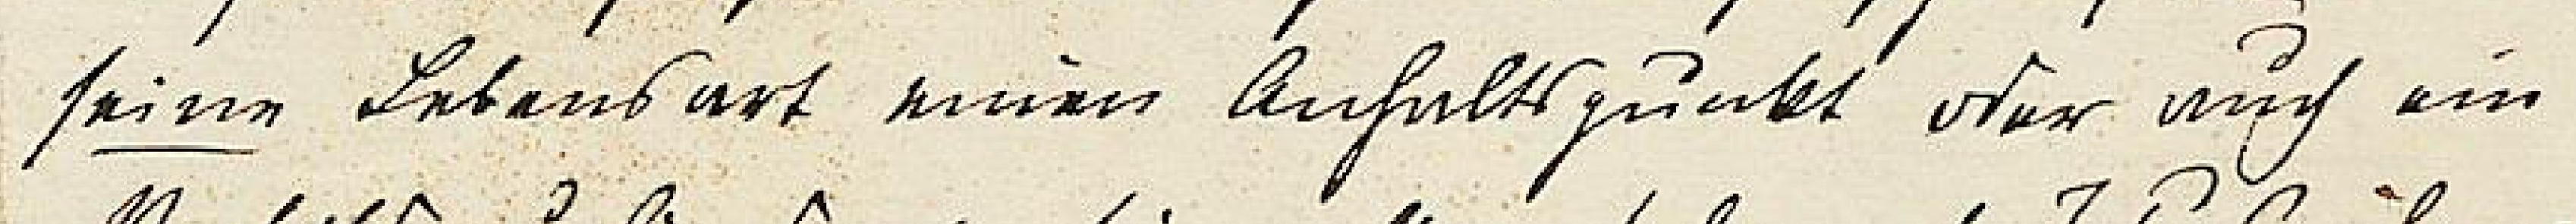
seine Lebensart einen Anhaltspunkt oder auch ein
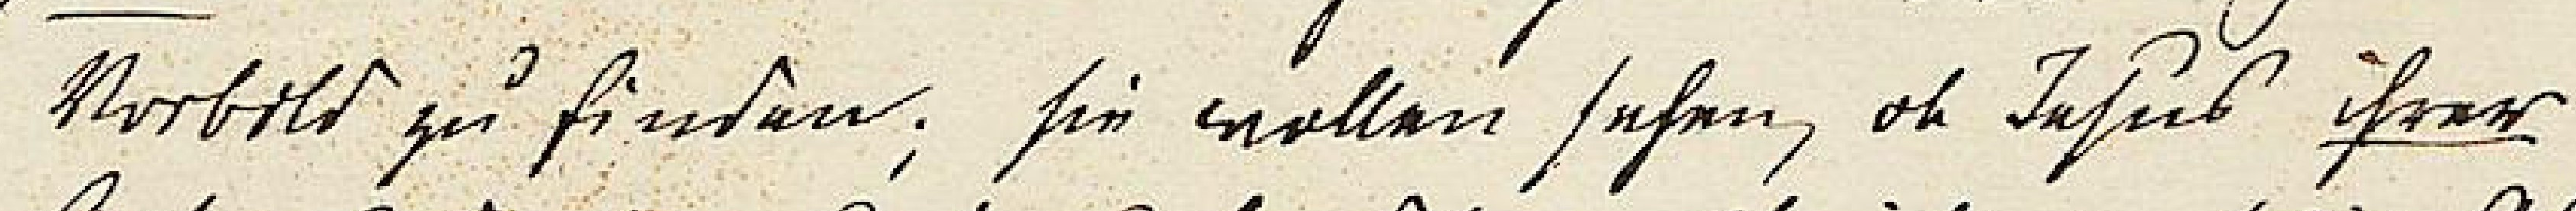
Vorbild zu finden; sie wollen sehen, ob Jesus ihrer
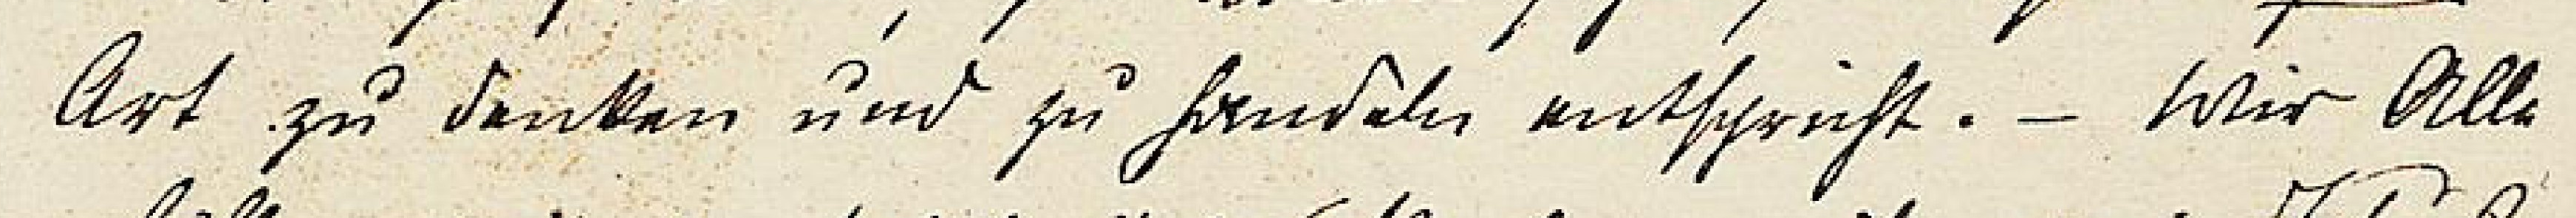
Art zu denken und zu handeln entspricht. _ Wir Alle
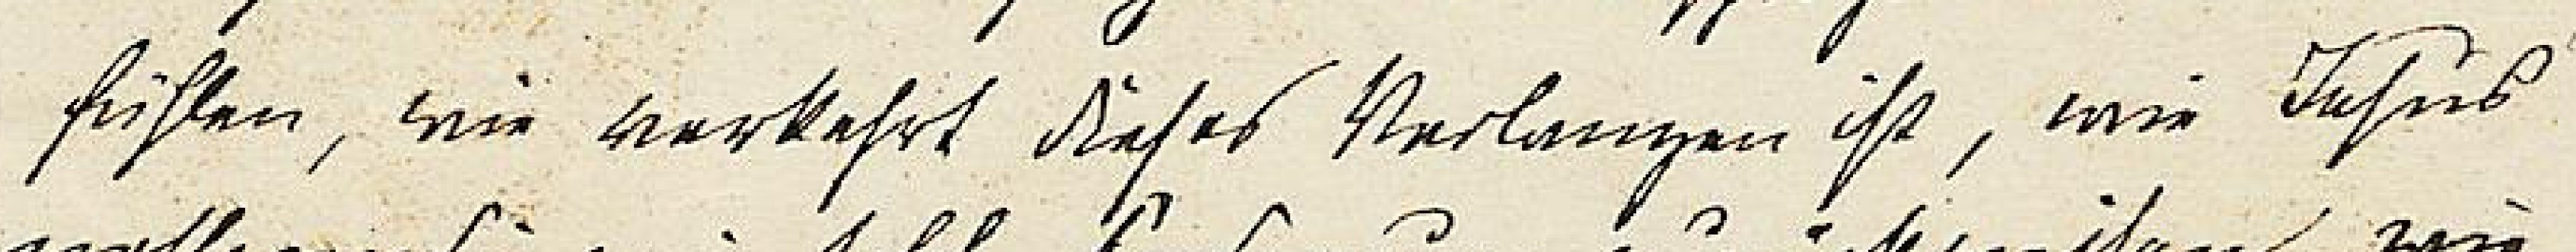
fühlen, wie verkehrt dieses Verlangen ist, wie Jesus
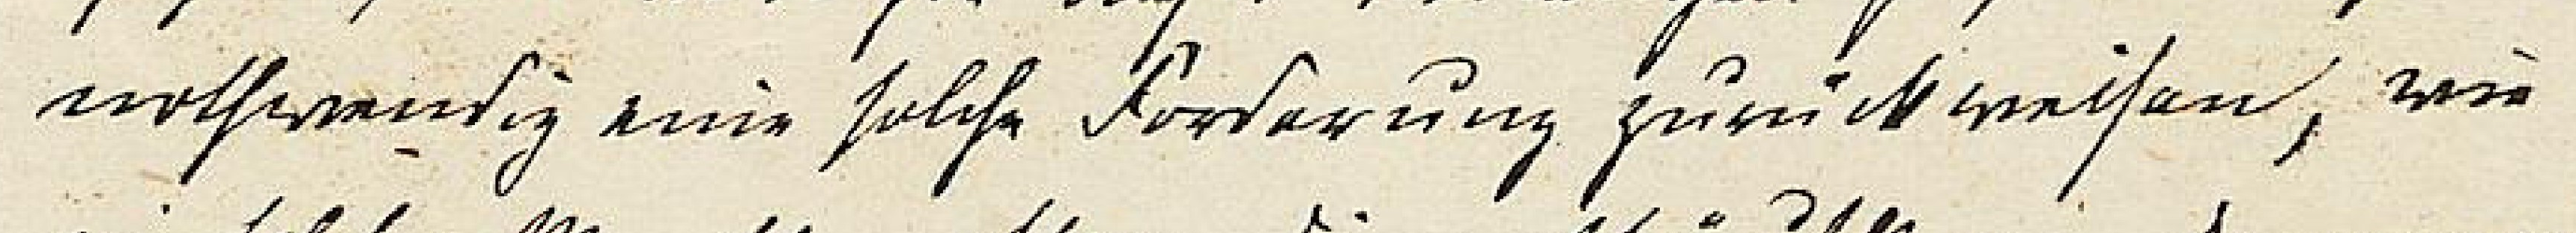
nothwendig eine solche Forderung zurückweisen, wie
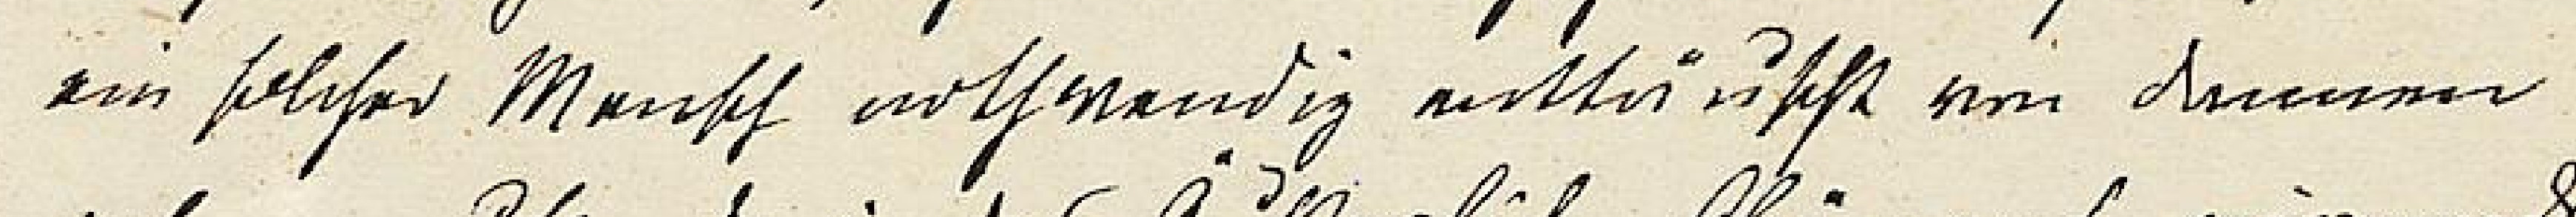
ein solcher Mensch nothwendig enttäuscht von dannen
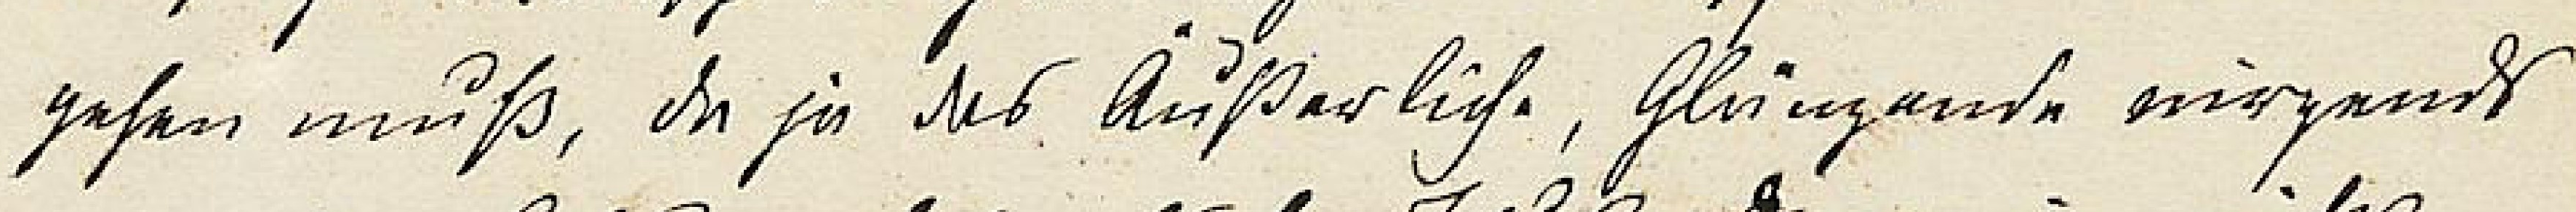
gehen muß, da ja das Äußerliche, Glänzend nirgends
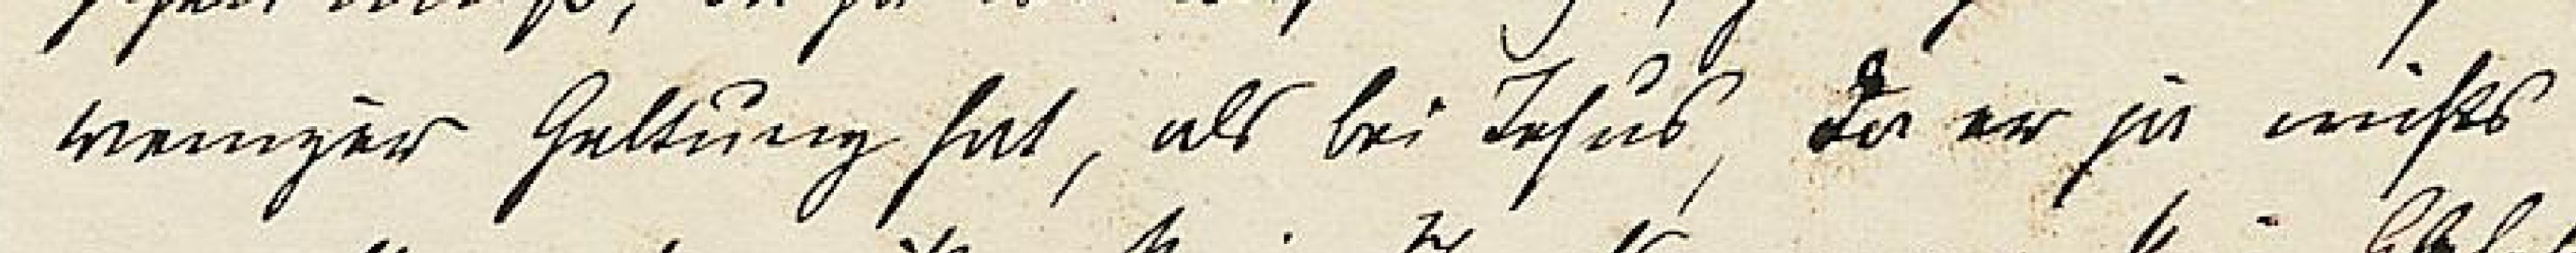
weniger Geltung hat, als bei Jesus, da er ja nichts
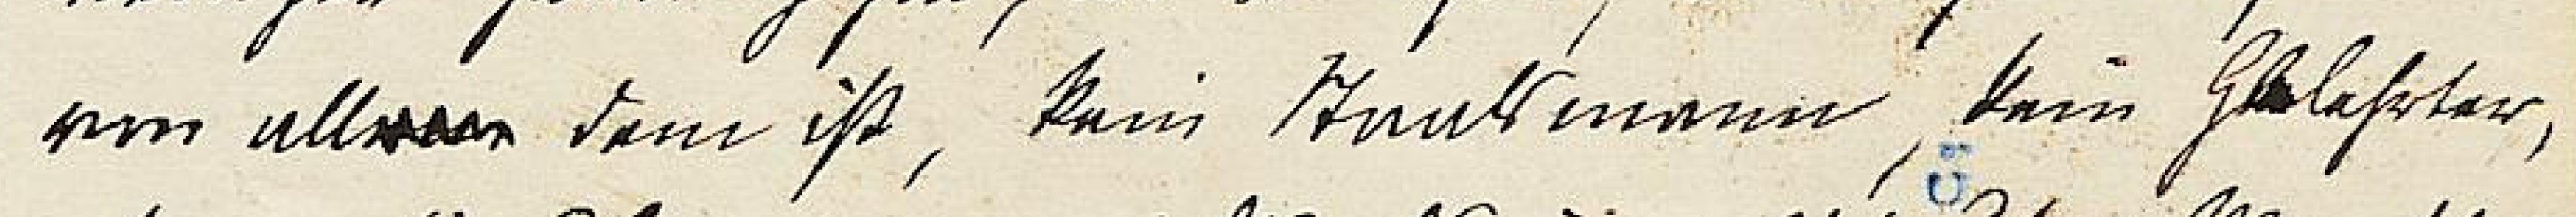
von alle dem ist, kein Staatsmann, kein Gelehrter,
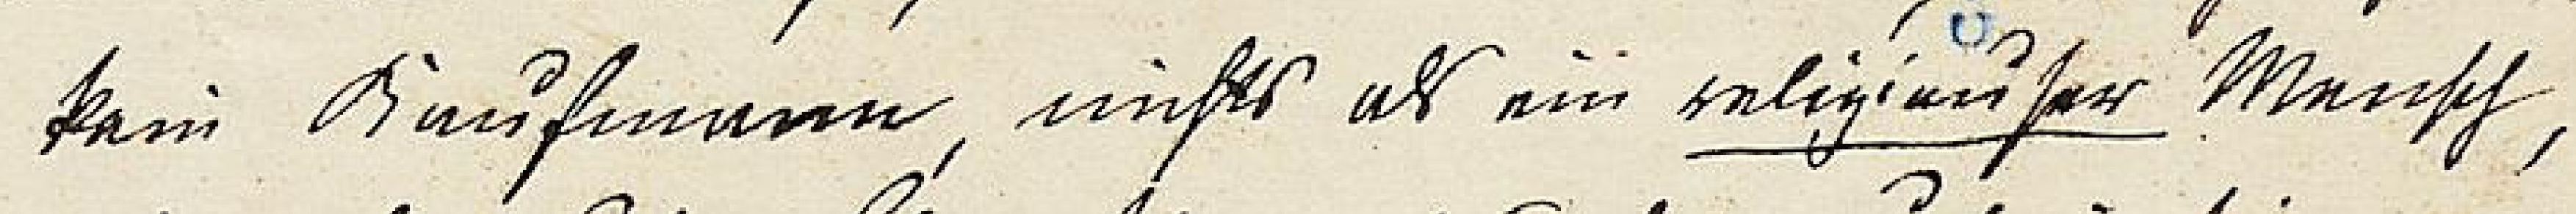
kein Kaufmann, nichts als ein religieuser Mensch,
